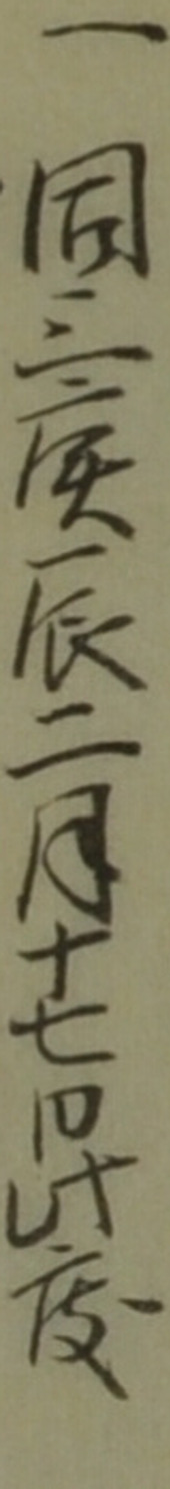一同三庚辰二月十七日此度
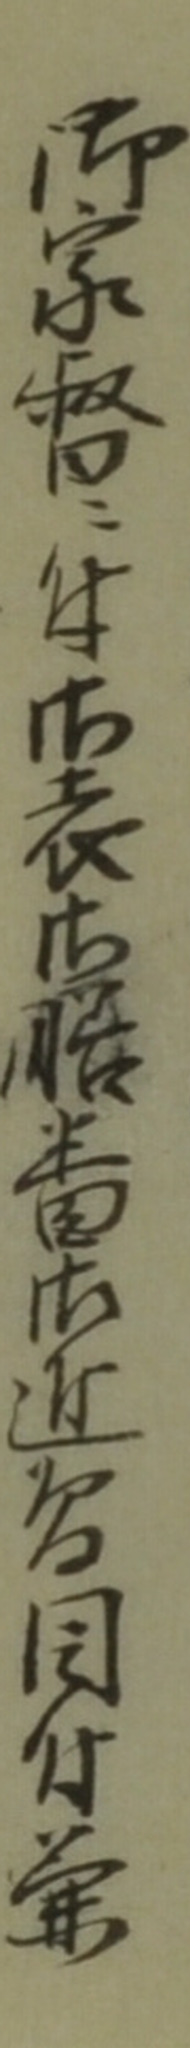一御家督ニ付御表御膳番御近習目付兼
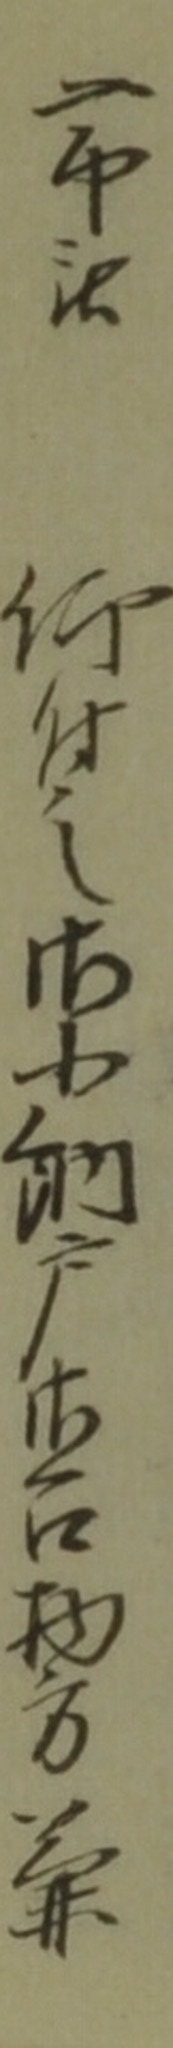帯被仰付之御小納戸御召物方兼
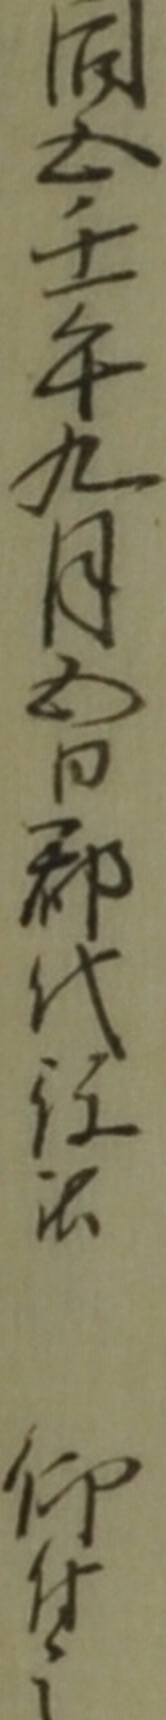一同五壬午九月五日郡代役被仰付之
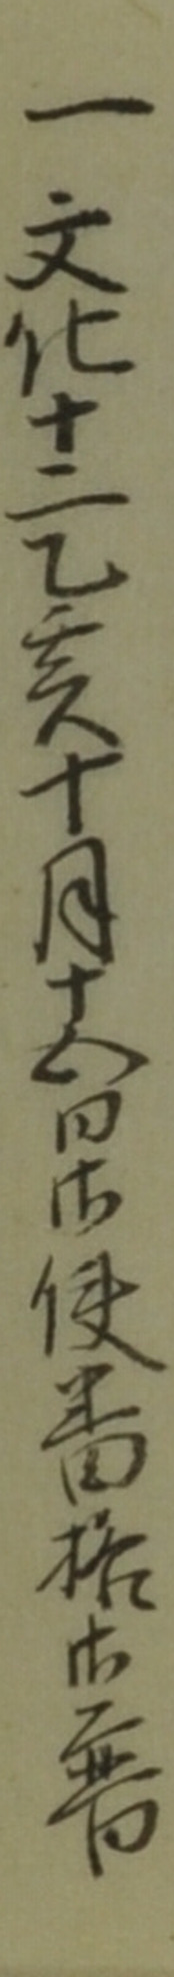一文化十二乙亥十月十五日御使番格御普
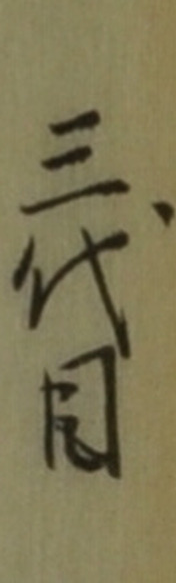三代目
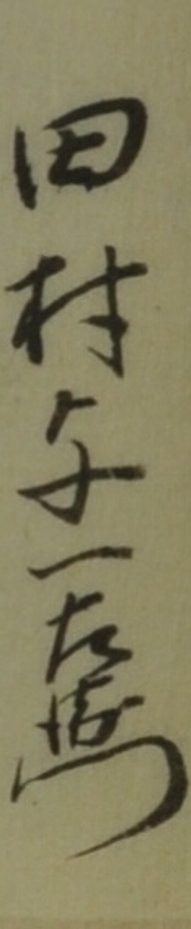田村与一左衛門
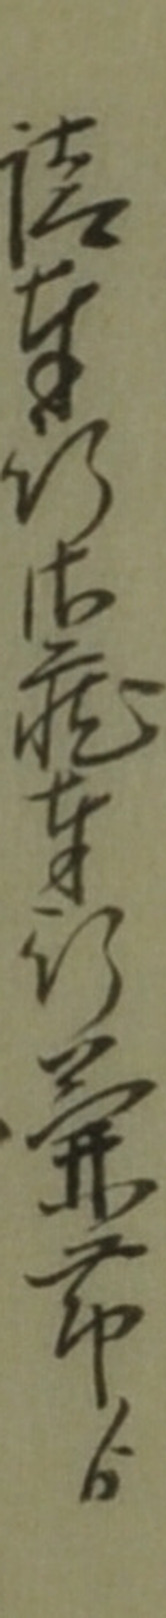請奉行御蔵奉行兼帯ゟ
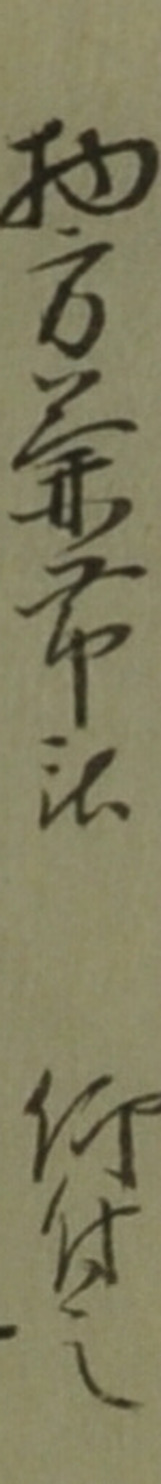物方兼帯被仰付之
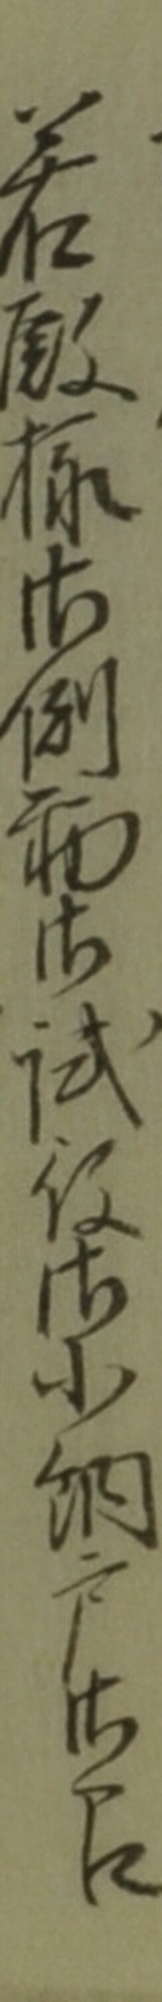若殿様御側勤御試役御小納戸御召
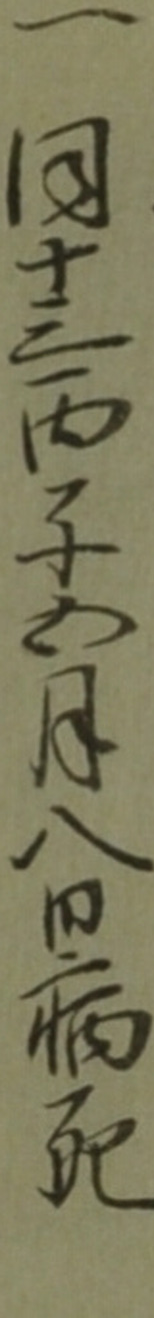一同十三丙子五月八日病死
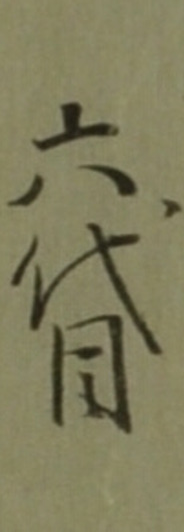六代目
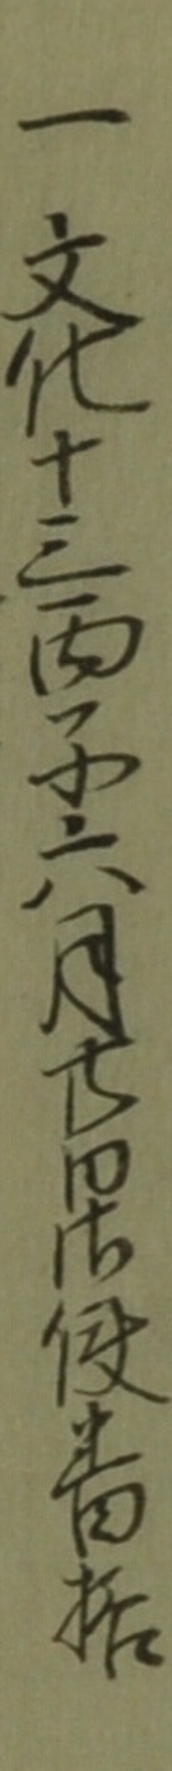一文化十三丙子六月廿日御使番格
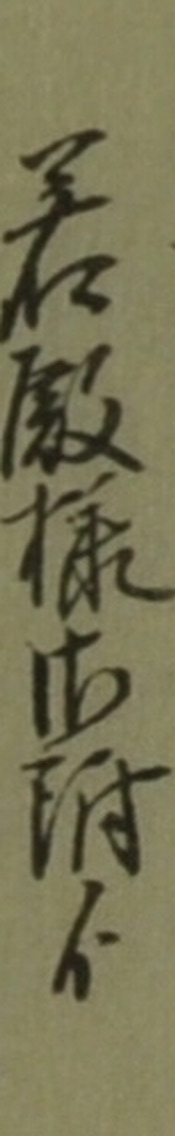若殿様御附ゟ
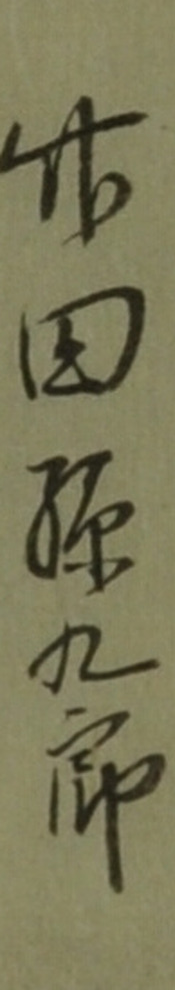竹田孫九郎
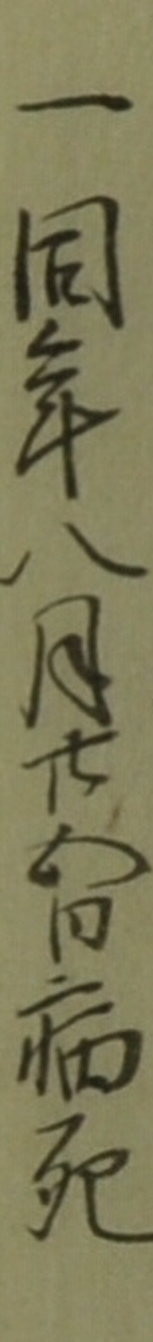一同年八月廿五日病死
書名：諸御役代々録（四）
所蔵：伊那市立高遠町図書館・合同会社AMANE
